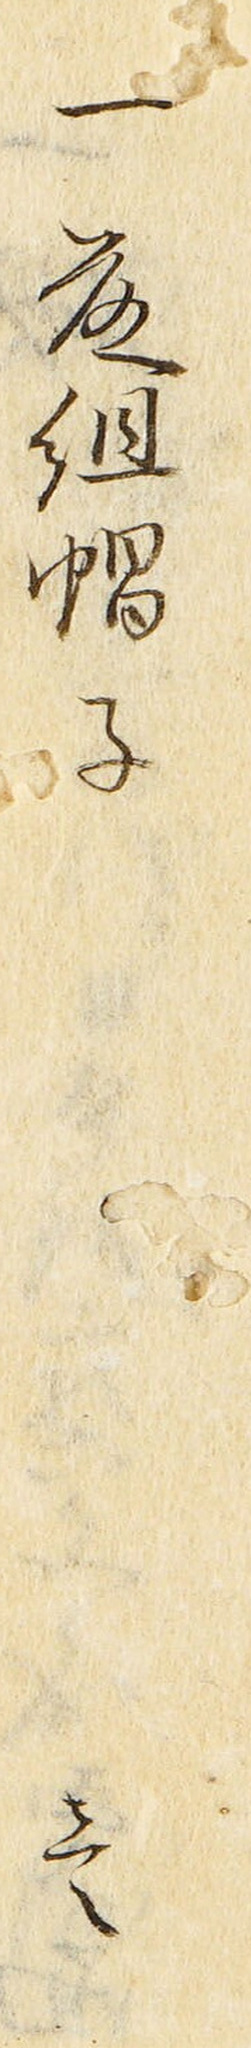一籐組ぼ帽子壱
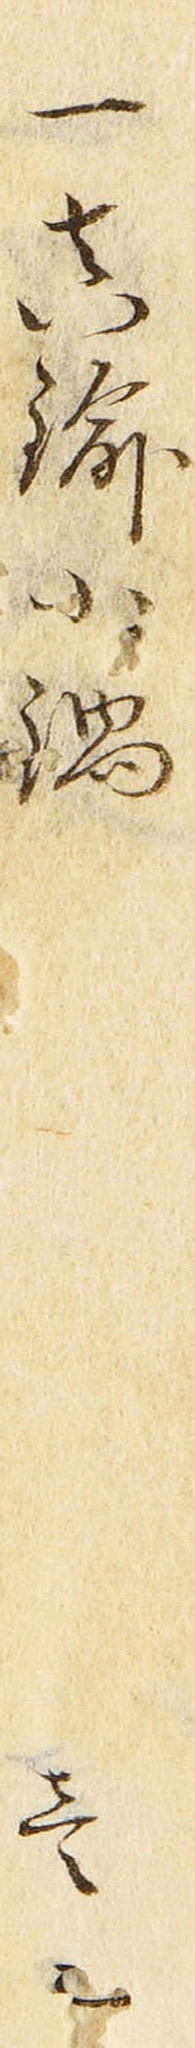一真鍮小鍋壱
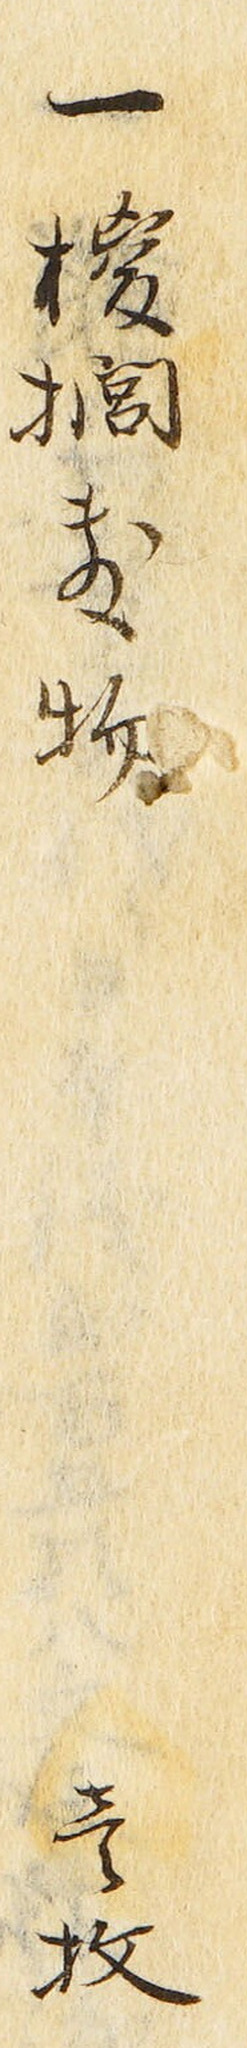一？櫚敷物壱枚
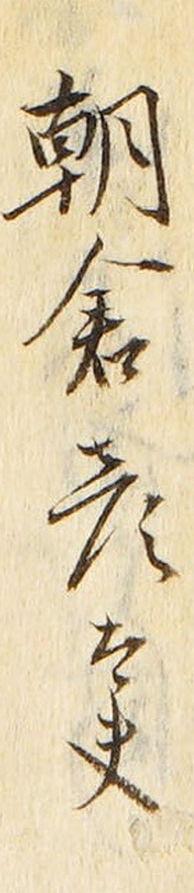朝倉彦太夫
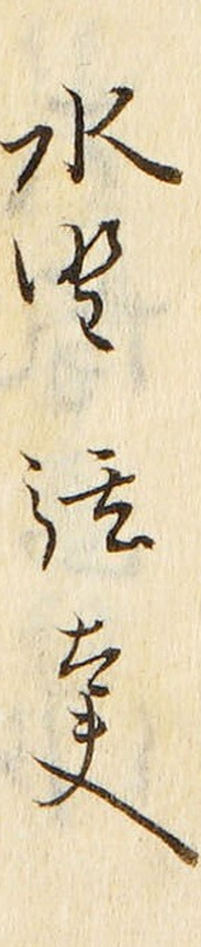水野弦太夫
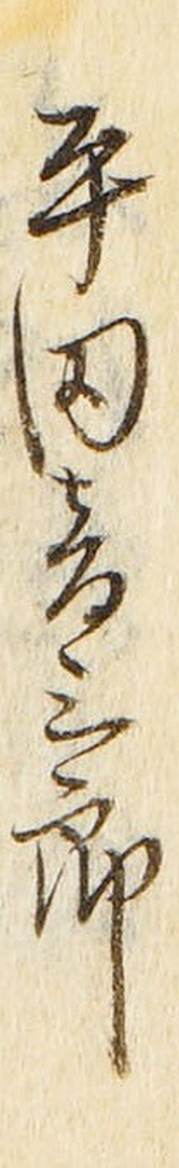平田青三郎
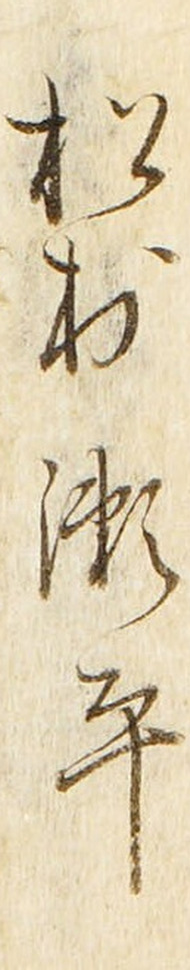松村瀬平
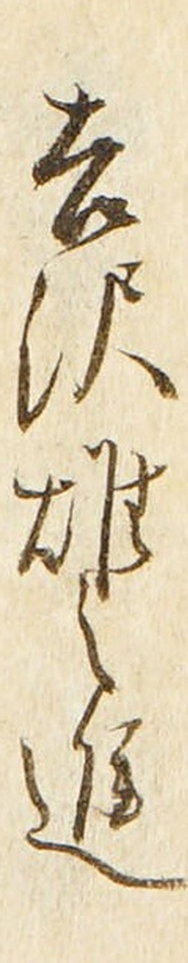吉沢雄之進
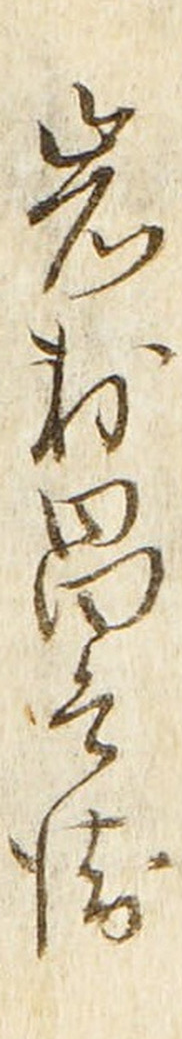岩村？兵衛
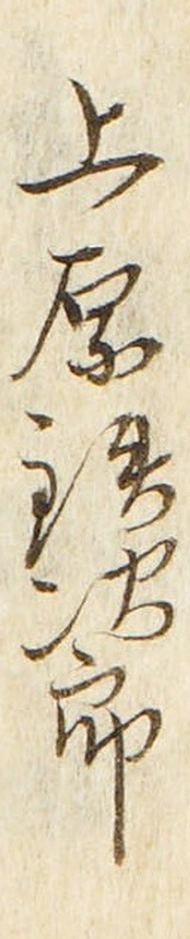上原鉄次郎
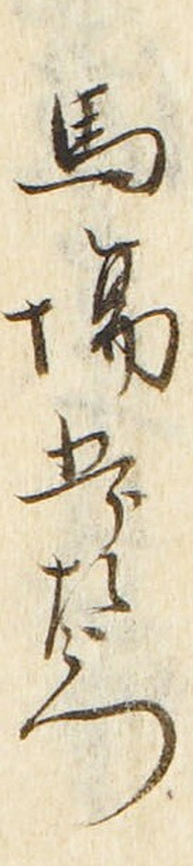馬場五郎左衛門

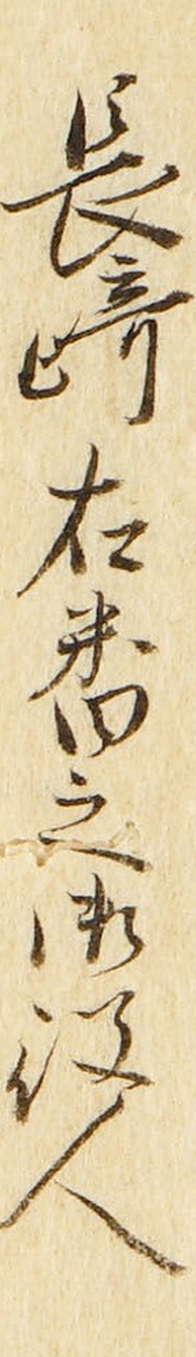長崎右番之御役人
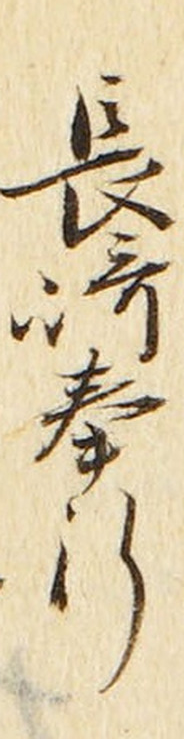長崎奉行
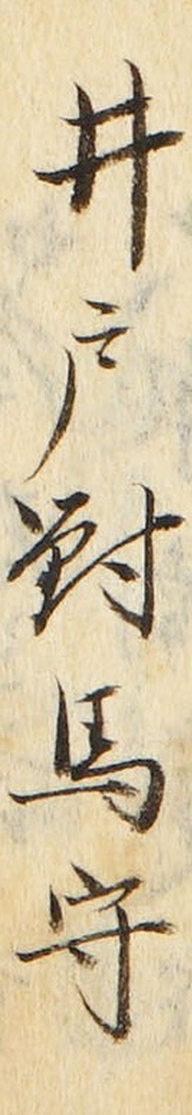井戸対馬守
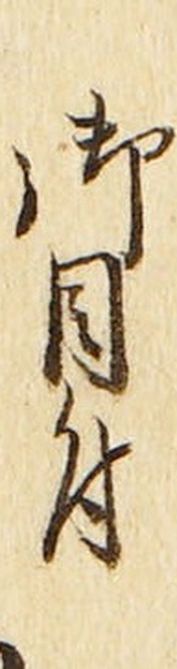御目付
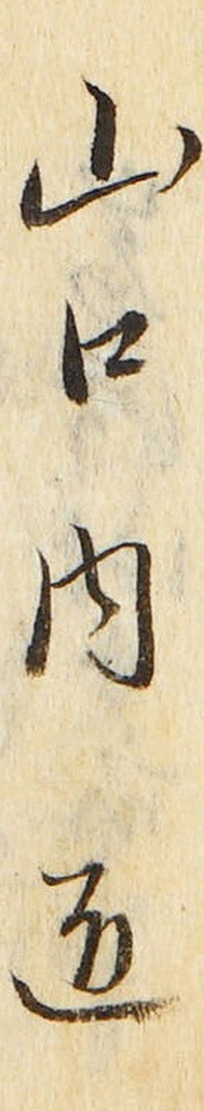山口内通
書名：漂流人弥市之記
